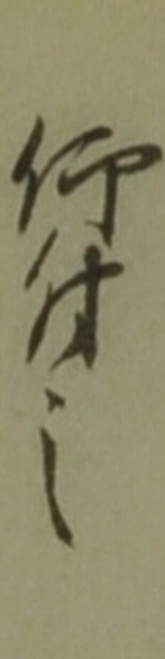仰付之
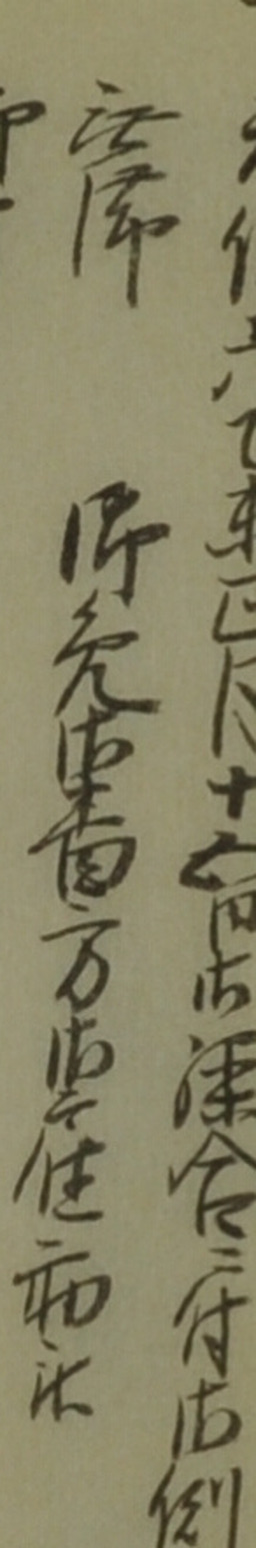無滞御免御番方御雇勤被
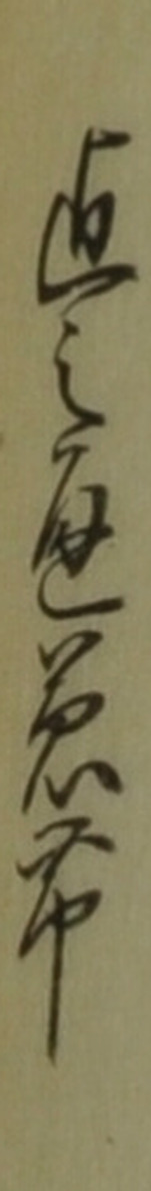迄之通兼帯
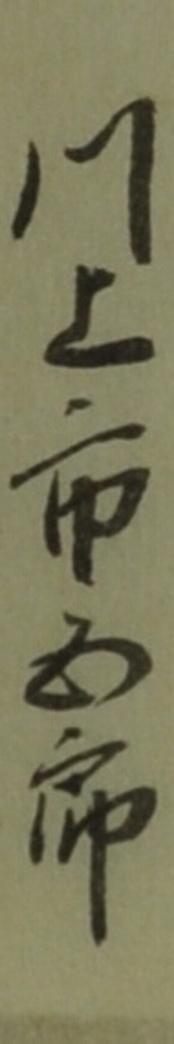川上市五郎
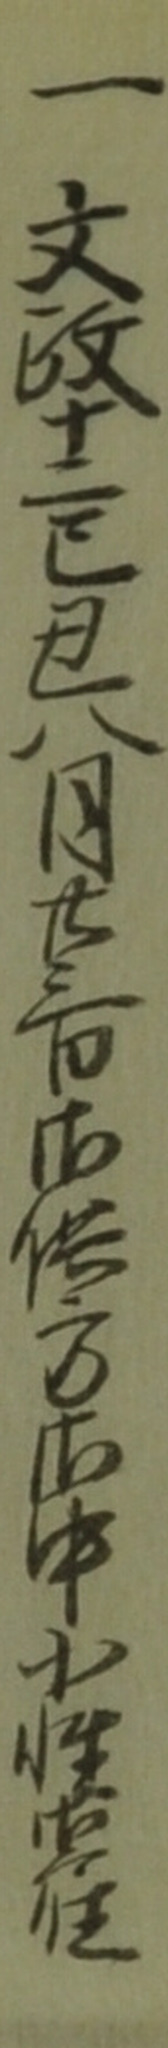一文政十二己丑八月廿三日御供方御中小性御雇
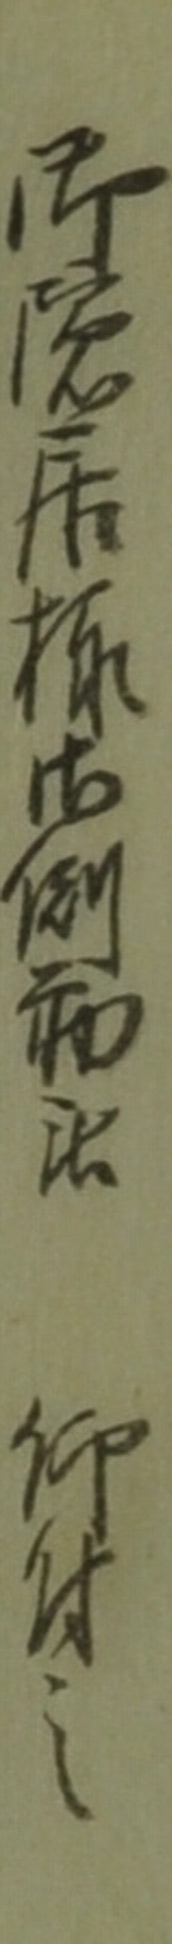一御隠居様御側勤被仰付之
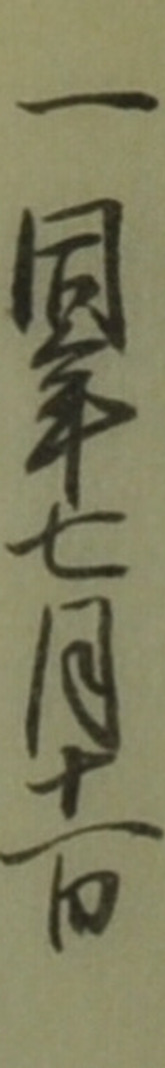一同年七月十一日
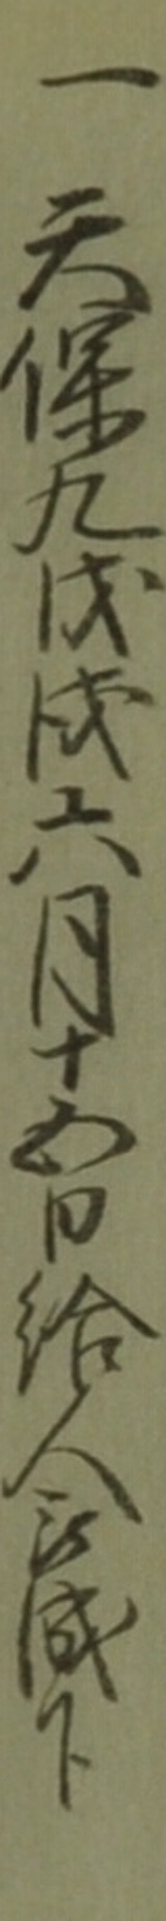一天保九戊戌六月十五日給人被成下
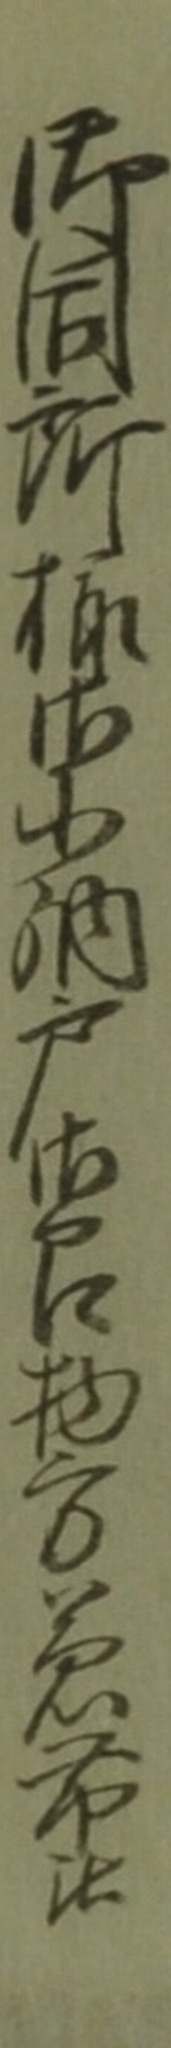御同所様御小納戸御召物方兼帯被
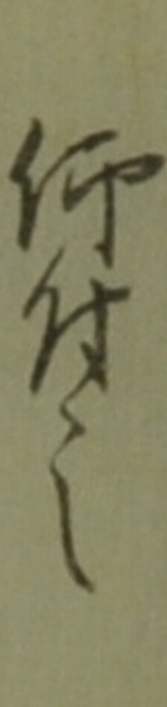仰付之
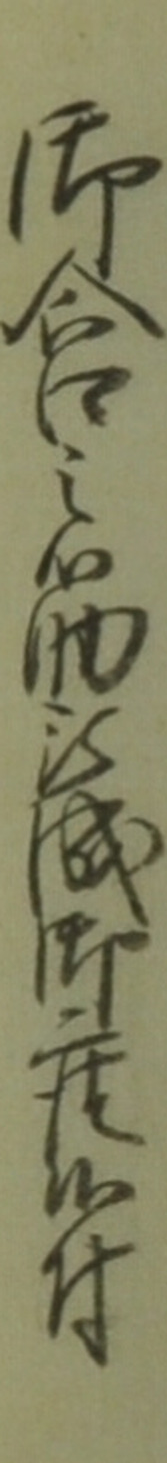御含之筋被成御座候付

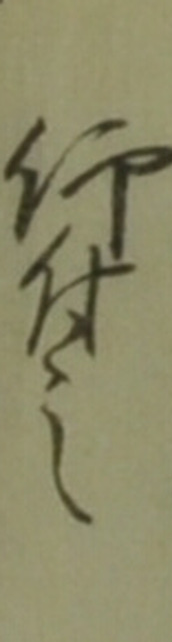仰付之
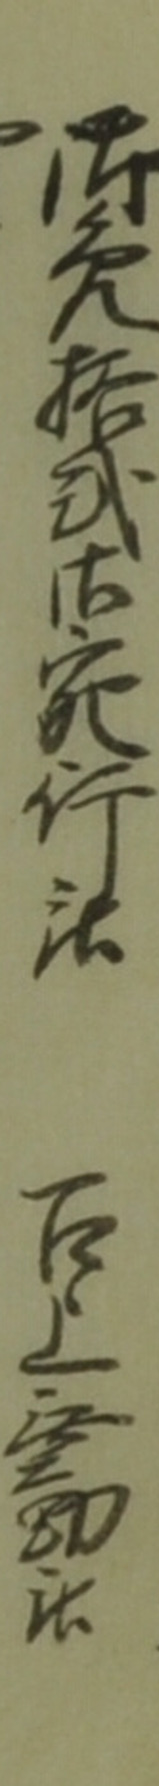御免格式御宛行被召上無勤被
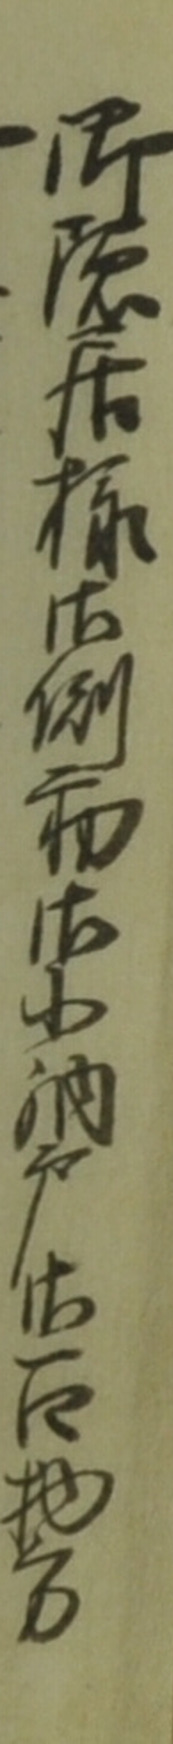御隠居様御側勤御小納戸御召物方
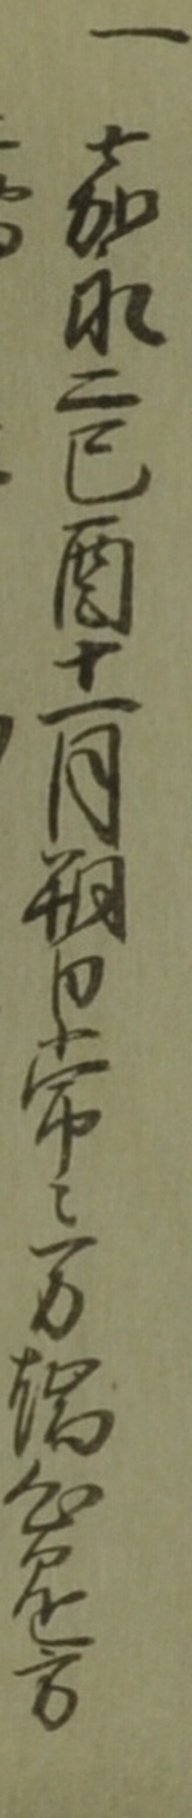一嘉永二己酉十一月朔日常々万端心懸方
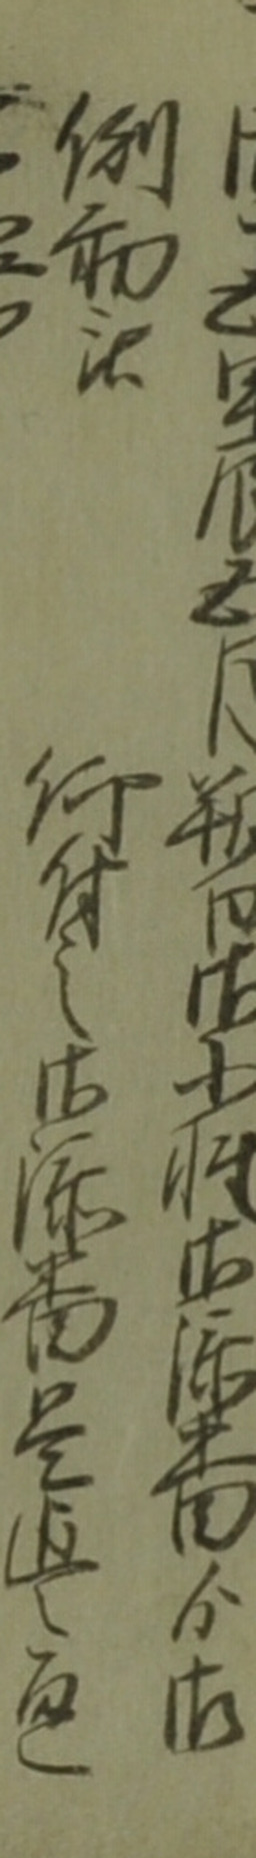側勤被仰付之御添番是迄之通
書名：諸御役代々録（五）
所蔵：伊那市立高遠町図書館・合同会社AMANE
